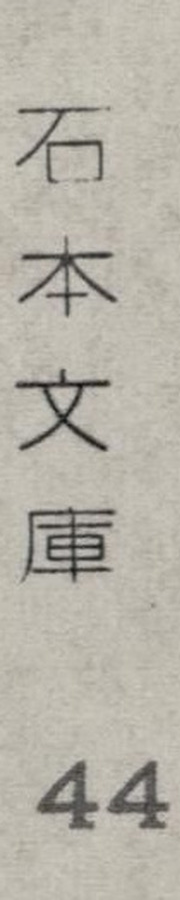石本文庫

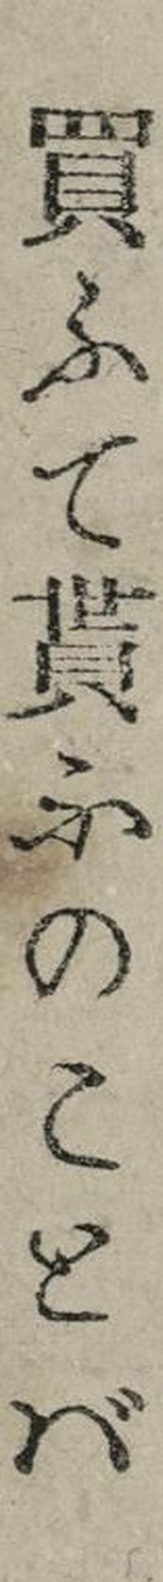買ふて貰ふのことば
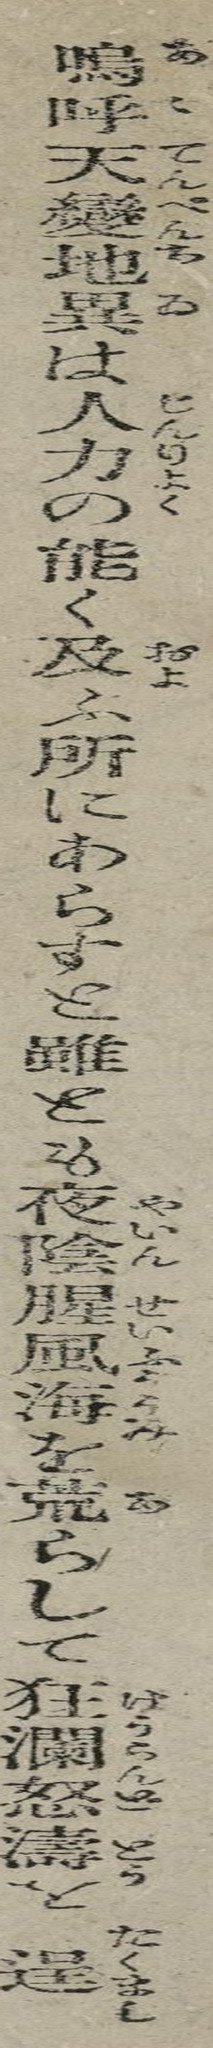嗚呼天變地異は人力の能く及ふ所にあらすと雖とも夜陰腥風海を荒らして狂瀾怒濤と逞
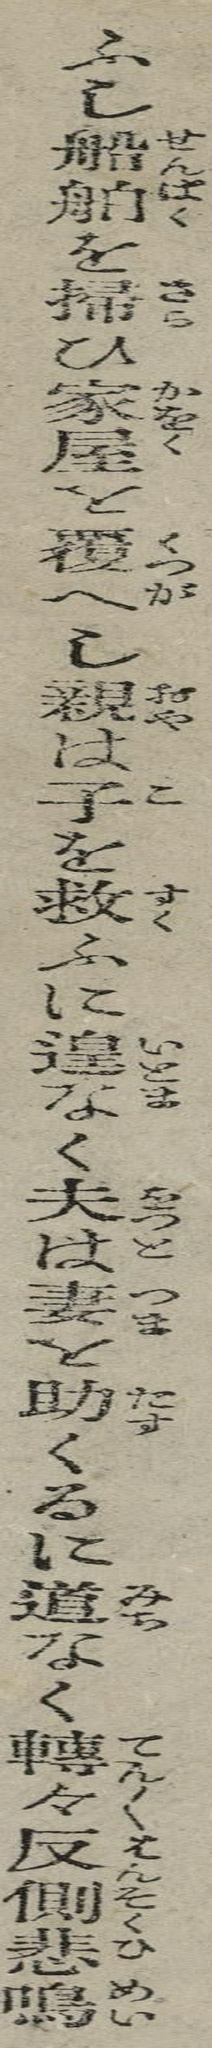ふし船舶を掃ひ家屋を覆へし親は子を救ふに遑なく夫は妻を助くるに道なく轉々反側悲鳴
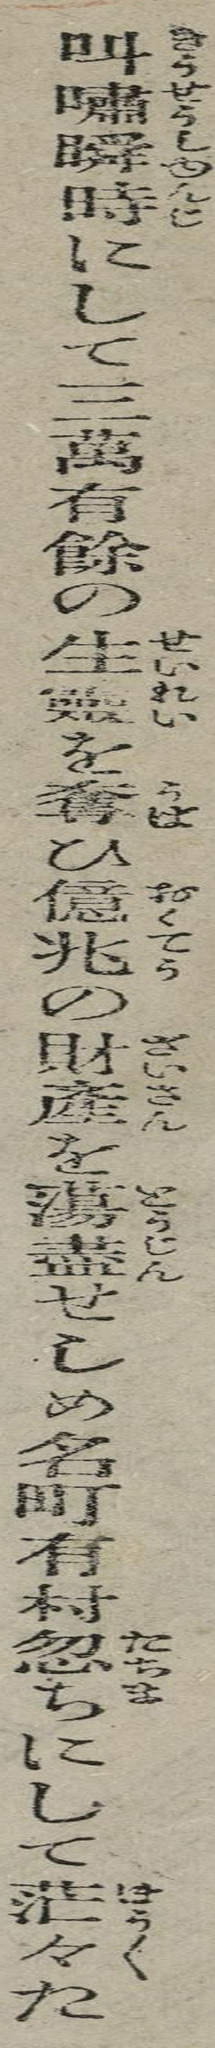叫嘯瞬時にして三萬有餘の生靈を奪ひ億兆の財産を蕩盡せしめ名町有村忽ちにして茫々た
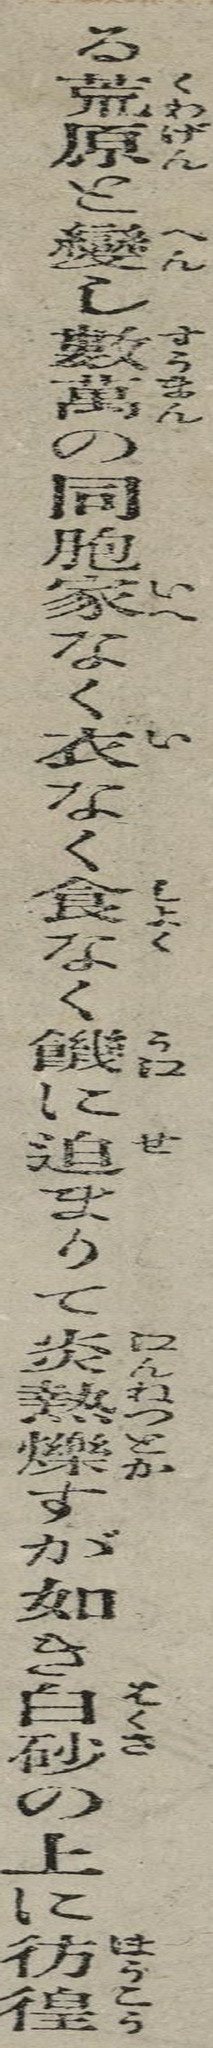る荒原と變し數萬の同胞家なく衣なく食なく餓に迫まりて炎熱爍すが如き白砂の上に彷徨
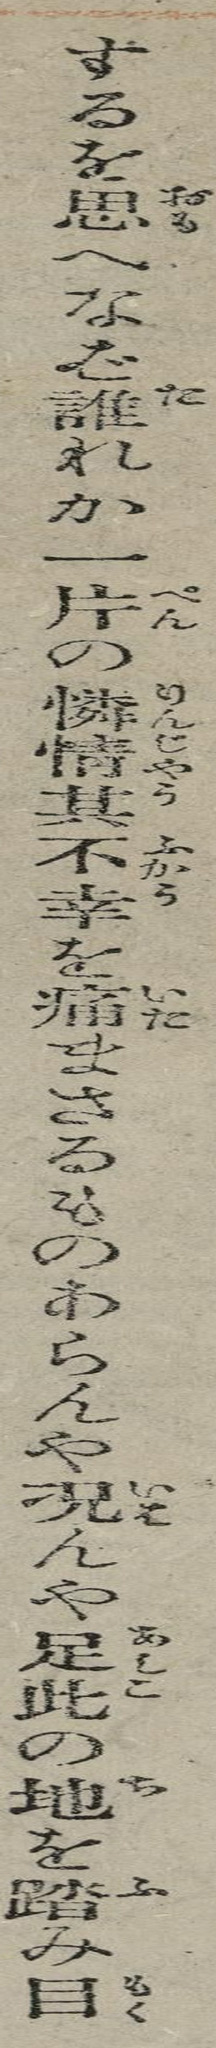するを思えなば誰れか一片の憐情其不幸を痛まさるものあらんや況んや足此の地を踏み目
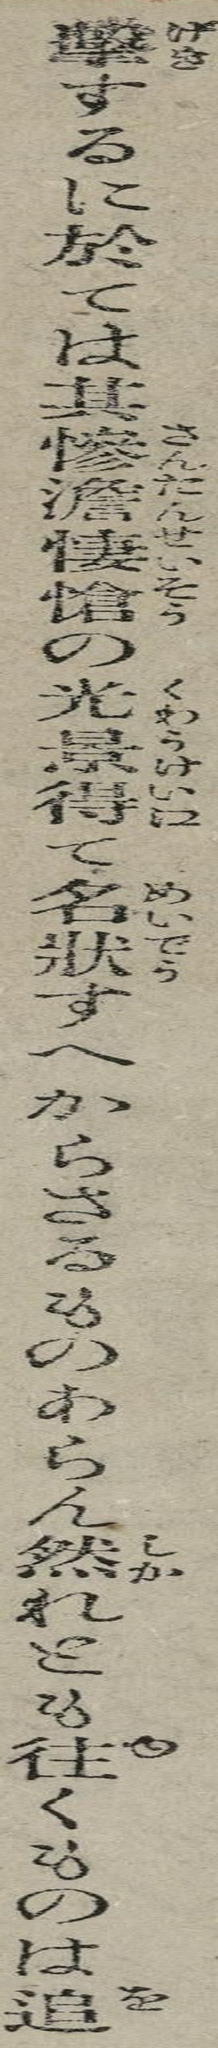撃するに於ては其惨憺悽愴の光景得て名狀すへからさるものあらん然れとも往くものは追
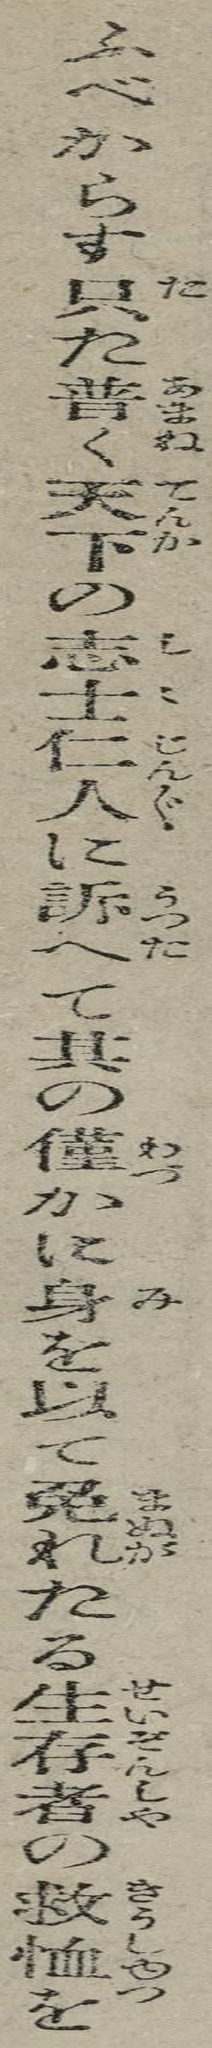ふべからす只た普く天下の志士仁人に訴へて其の僅かに身を以て免れたる生存者の救恤を
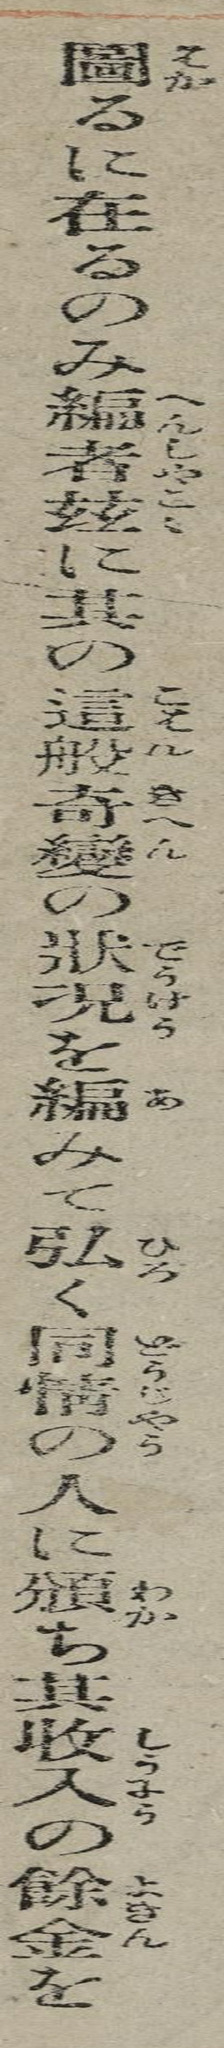圖るに在るのみ編者茲に其の這般奇變の狀况を編みて弘く同情の人に頒ち其收入の餘金を
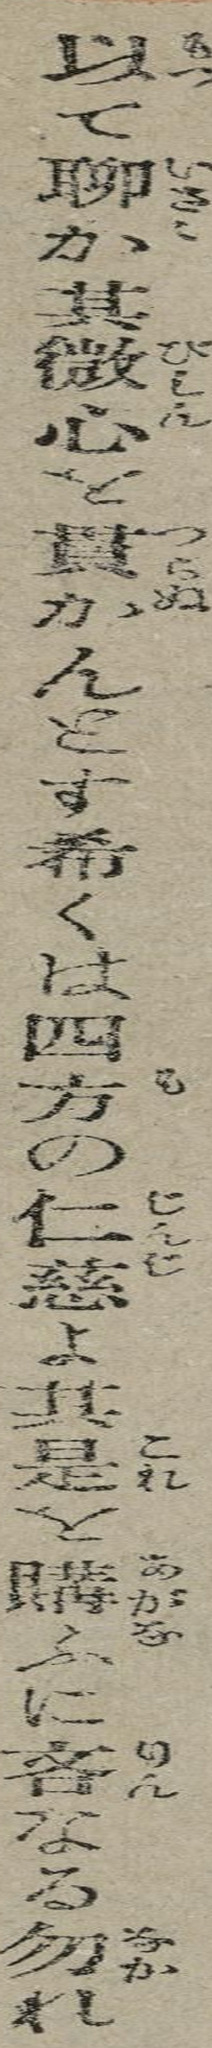以て聊か其微心を貫かんとす希くは四方の仁慈よ其是を購ふに吝なる勿れ
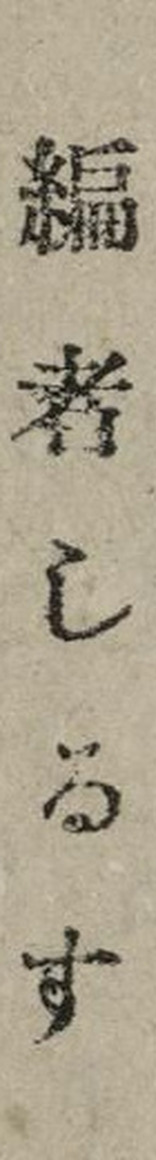編者しるす
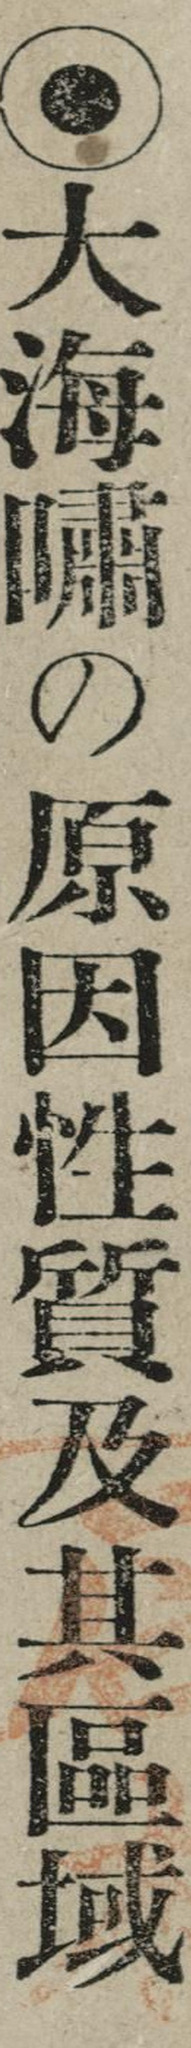〇大海嘯の原因性質及其區域
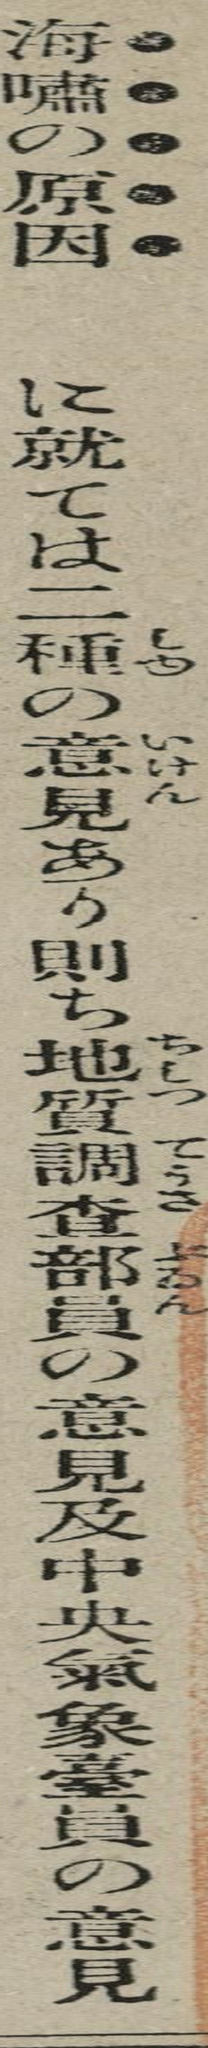海嘯の原因に就ては二種の意見あり則ち地質調査部員の意見及中央氣象臺員の意見
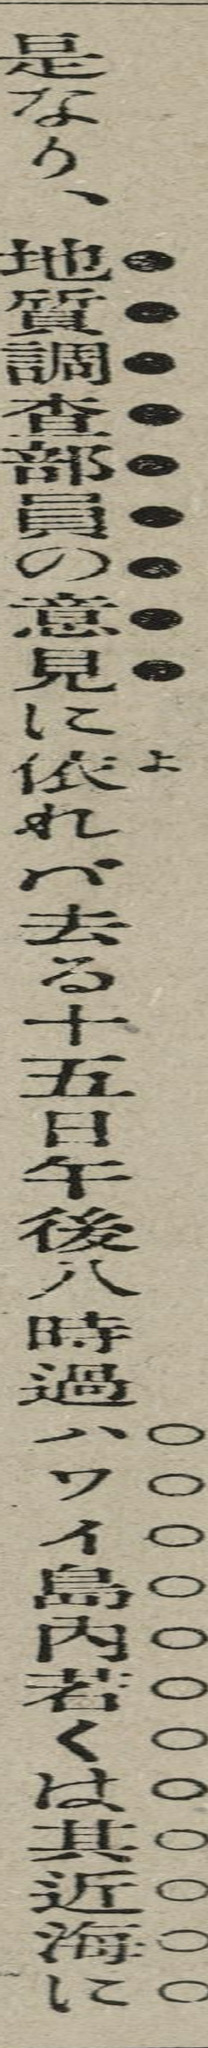是なり、地質調査部員の意見に依れば去る十五日午前八時過ハワイ島内若くは其近海に
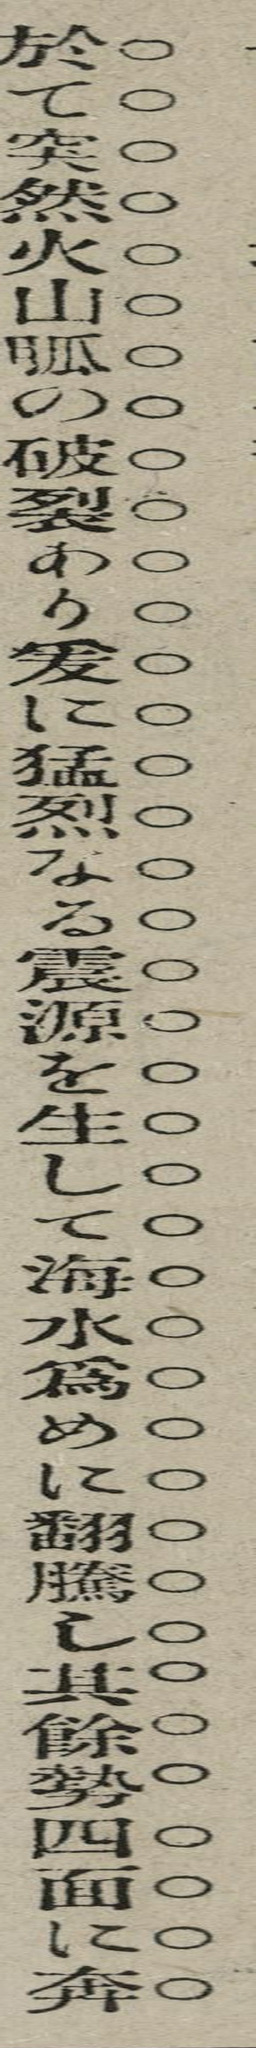於て突然火山胍の破裂あり爲に猛烈なる震源を生して海水爲めに翻騰し其餘勢四面に奔
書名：三陸海嘯細見
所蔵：東京大学地震研究所図書室 Earthquake Research Institute Library, The University of Tokyo, JAPAN
